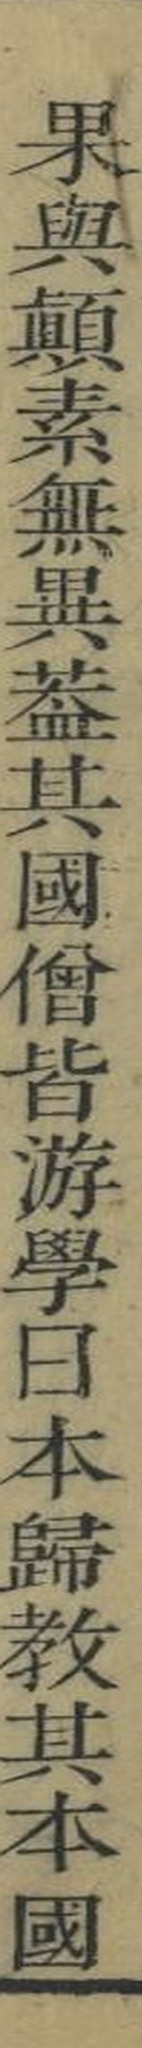果与顚素無異葢其国僧皆游学日本帰教其本国
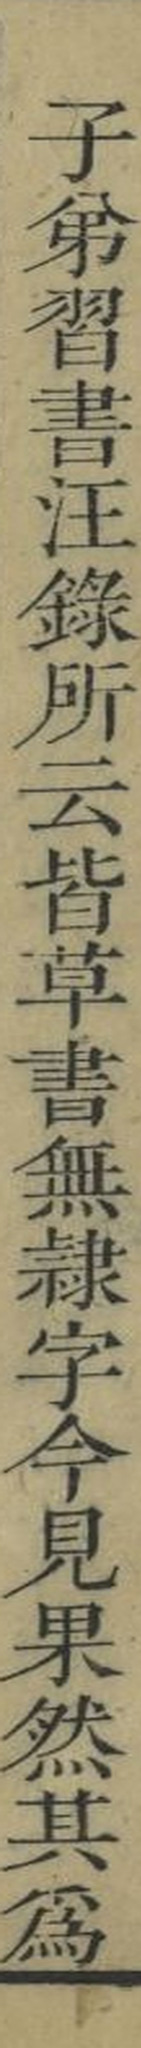子弟習書汪録所云皆草書無隷字今見果然其為
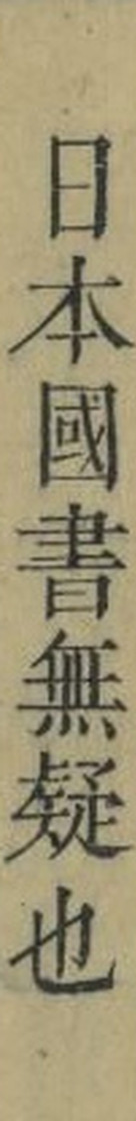日本国書無疑也
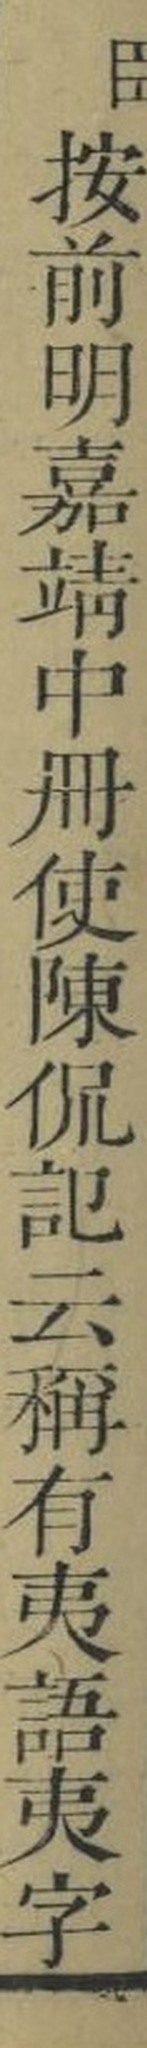臣按前明嘉靖中冊使陳侃記云称有夷語夷字
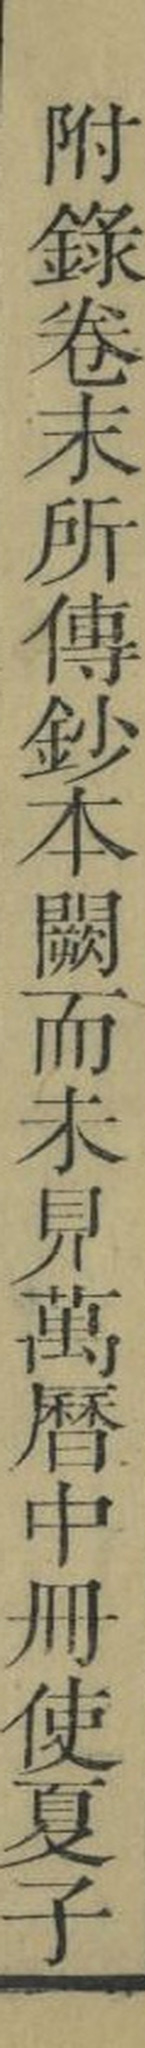附録巻末所伝鈔本闕而未見万暦中冊使夏子
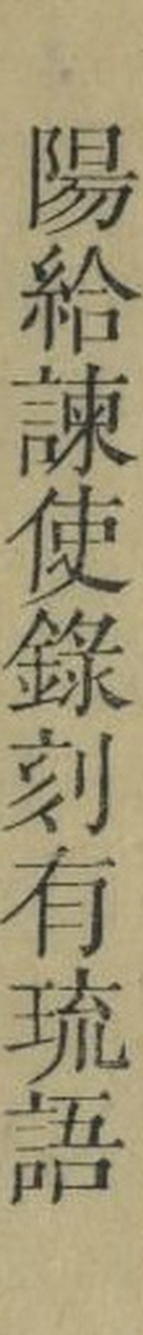陽給諫使録刻有琉語
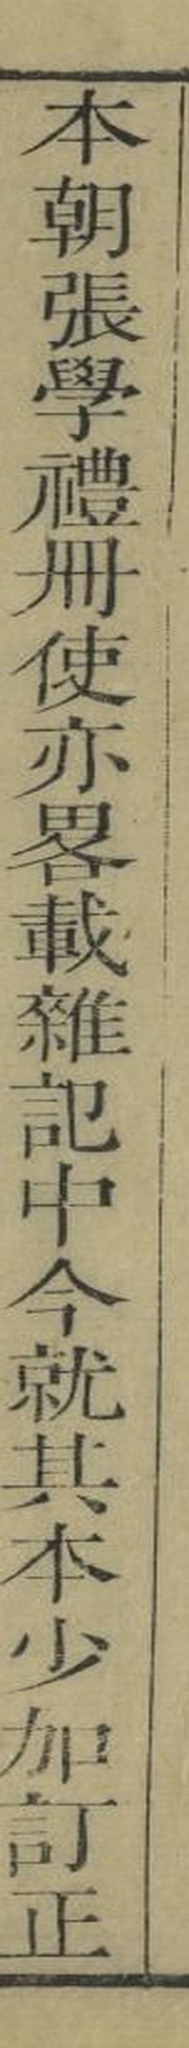本朝張学礼冊使亦略載雑記中今就其本少加訂正
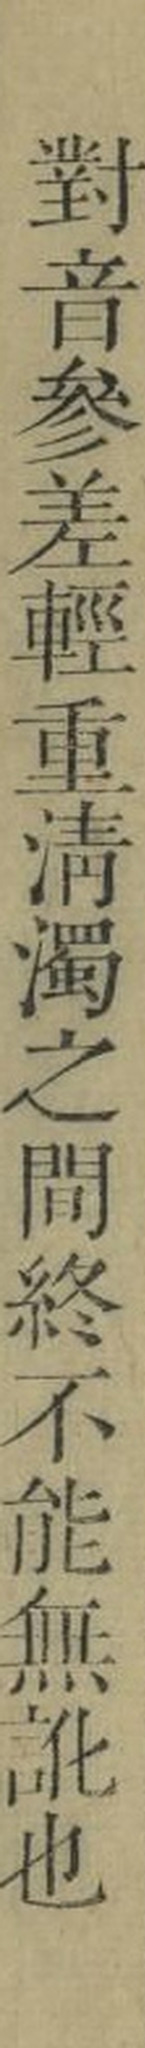対音参差軽重清濁之間終不能無訛也

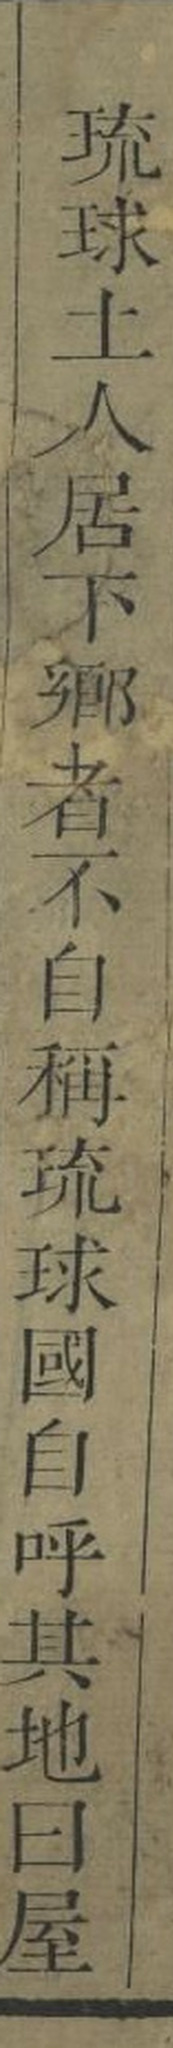琉球土人居下郷者不自称琉球国自呼其地曰屋
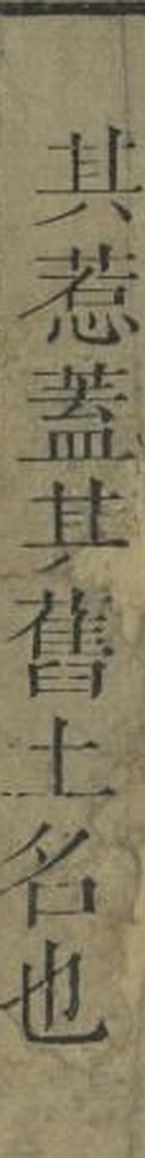其惹蓋其旧土名也

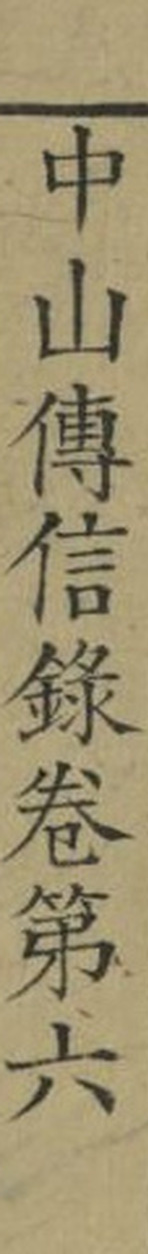中山伝信録巻第六
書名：中山伝信録 巻六
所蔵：University of the Ryukyus Library
